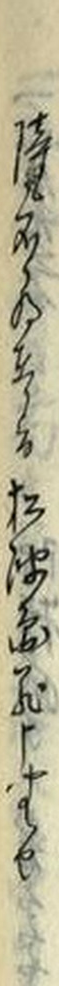障も不被為在候旨松波円蔵申聞候由
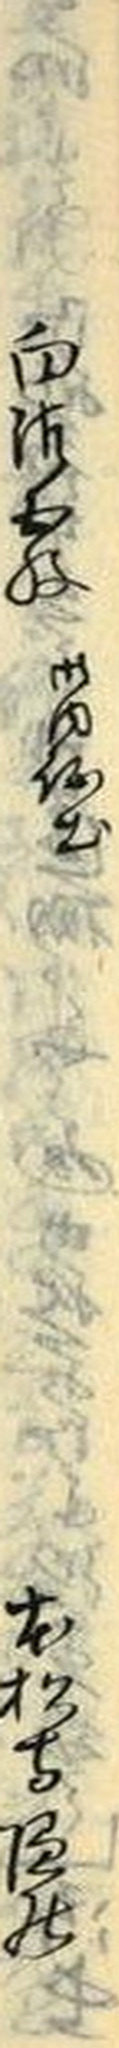白銀五枚御内証出本松寺隠居
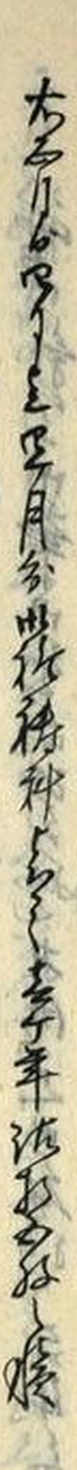右正月ゟ四月迄四ヶ月分御祈禱料被下之壱ヶ年銀拾五枚之積
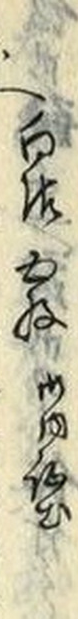外白銀五枚御内証出
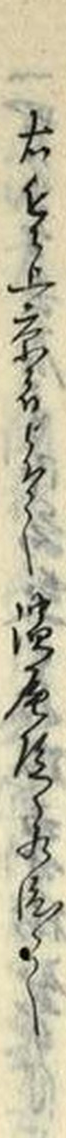右近々上京ニ付被下之浜尾殿へ相渡之
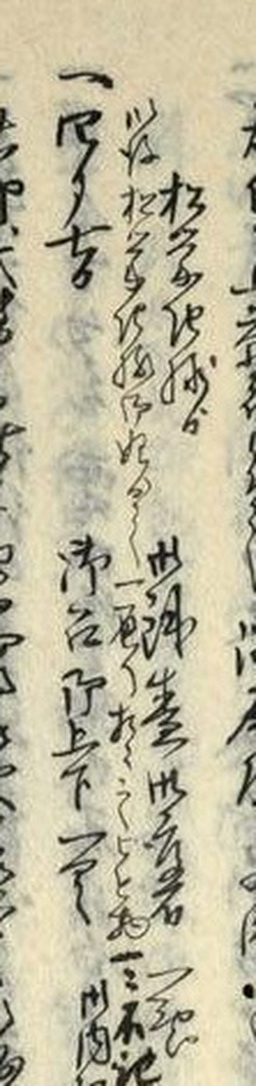以後松栄院様御始ゟ之一通り折々之被進物一々不記之
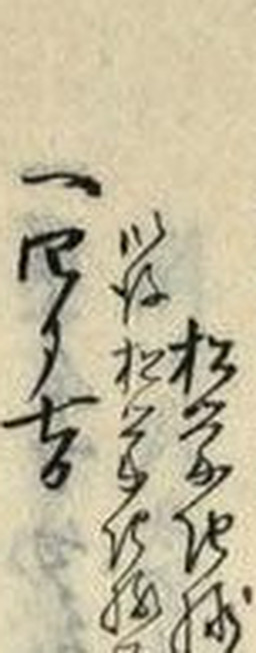一四月三日
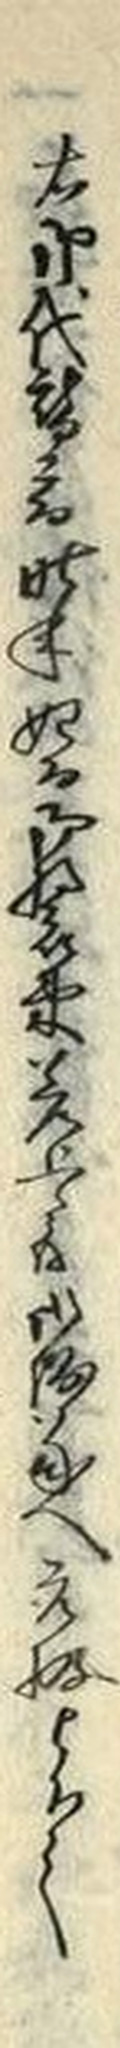右御代替ニ而昨年始而御装束差上候ニ付御側御用人取扱被下之
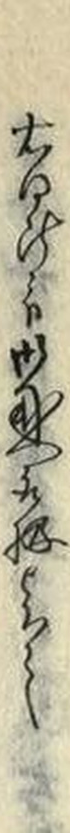右同断ニ付御用人取扱被下之
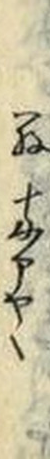一枚両部屋へ

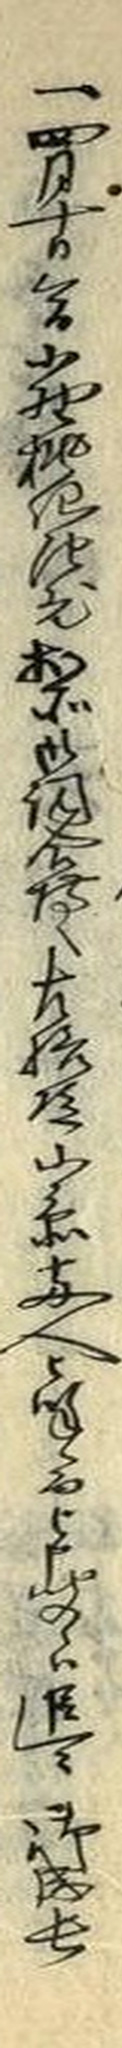一四月十日今日小野桃仙院老扣所御調合場へ左膳殿小兵衛両人被呼候而被申聞候ハ追々御成長
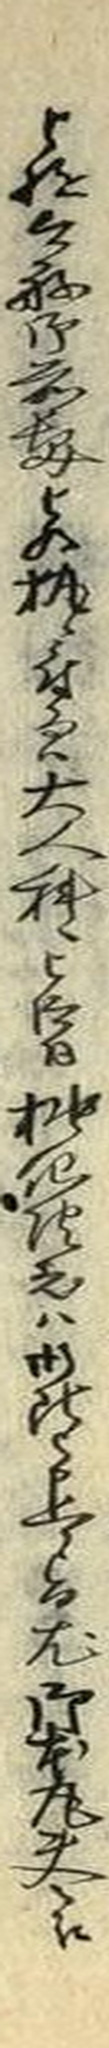被遊今般御前髪被為執候ニ付而ハ大人科へ被仰付桃仙院老ハ御断被申上候旨尤御本丸夫々江
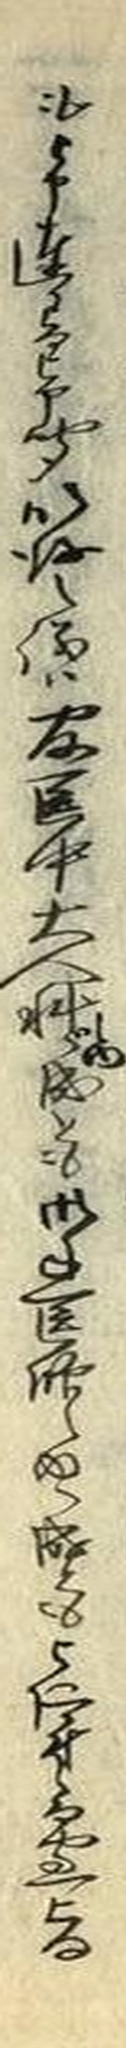も被申達候旨被申聞以後之儀ハ官医中大人科之内へ成とも御手医師之内へ成とも被仰付候而宜旨
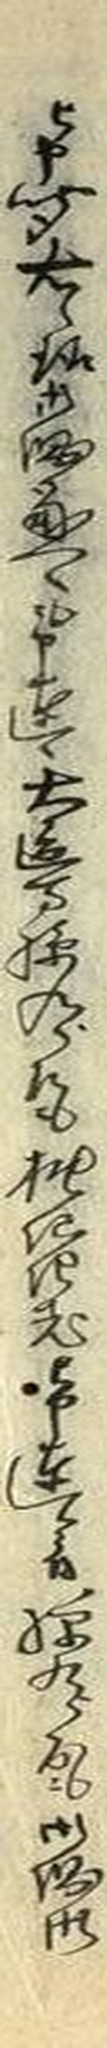被申聞右之趣御側御用人へも申達候大道寺孫九郎江も桃仙院老被申達候ニ付孫九郎ゟも御側御
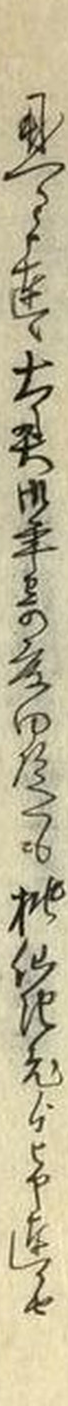用人へ被申達候大奥御年寄藤田殿へも桃仙院ゟ被申達候由
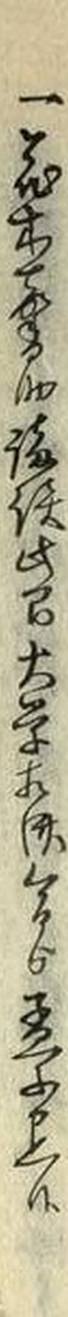一花木馨助講談此間大学相済今日ゟ孟子申上候
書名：少傅日録抄（斉善付側向頭取日記、在府）
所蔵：福井県文書館 Fukui Prefectural Archives
